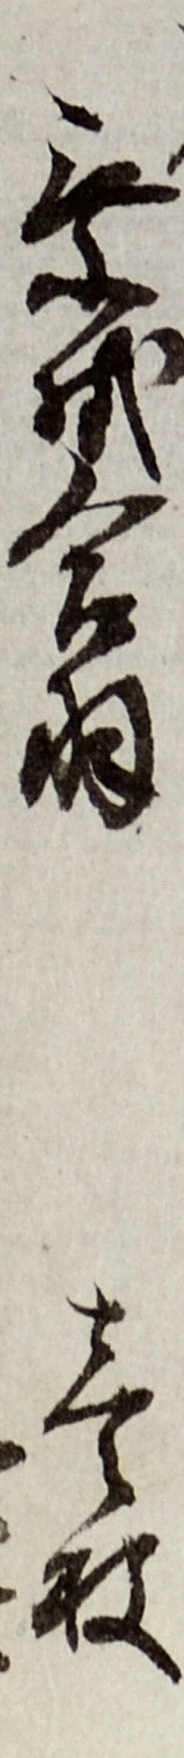乗掛合羽壱枚
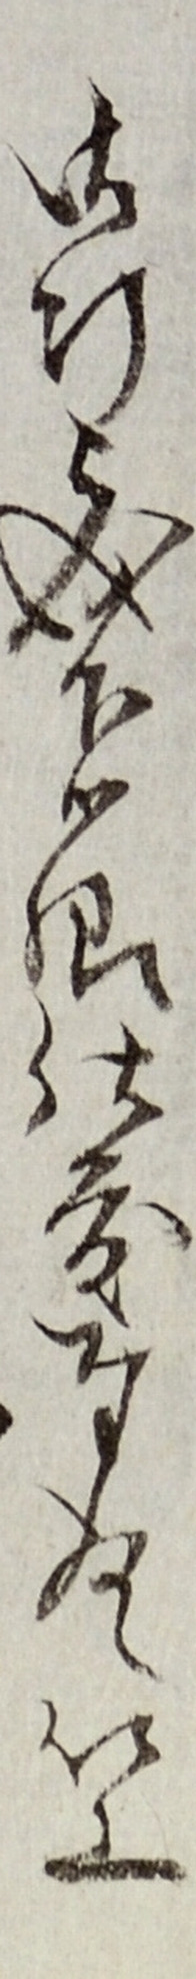御断被成下候様仕度奉存候以上
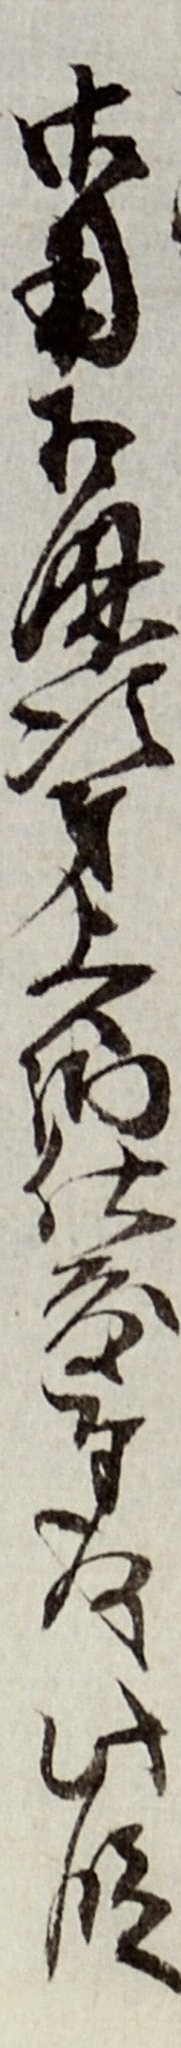御用相済次第上納仕度奉存候此段
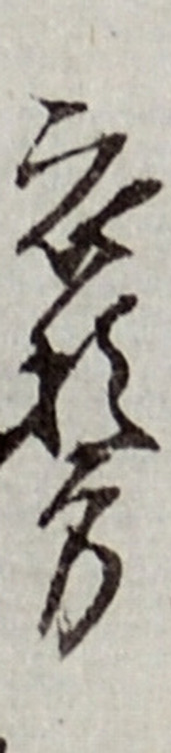衣類方
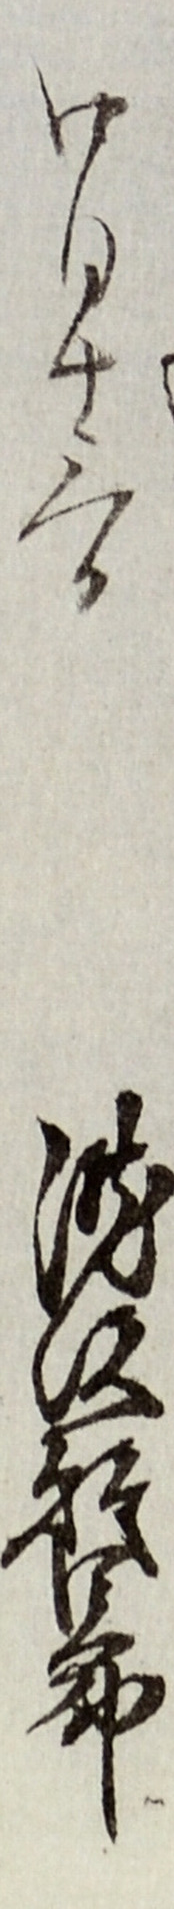四月十三日瀧沢雅四郎
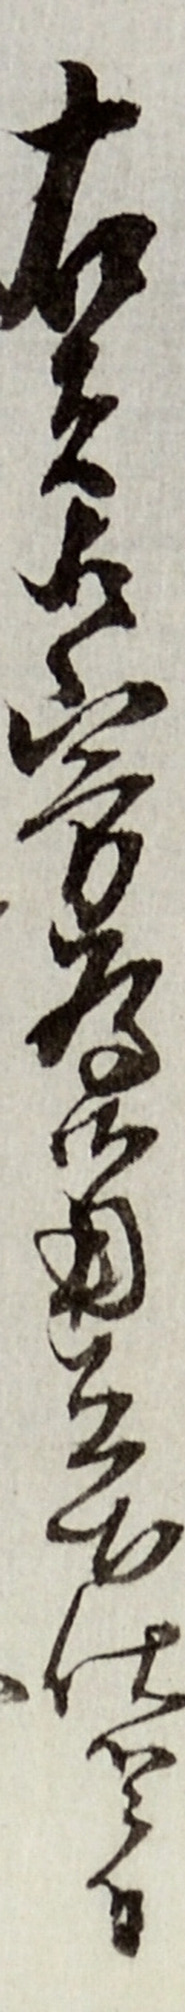右者御山方為御用在出仕候ニ付
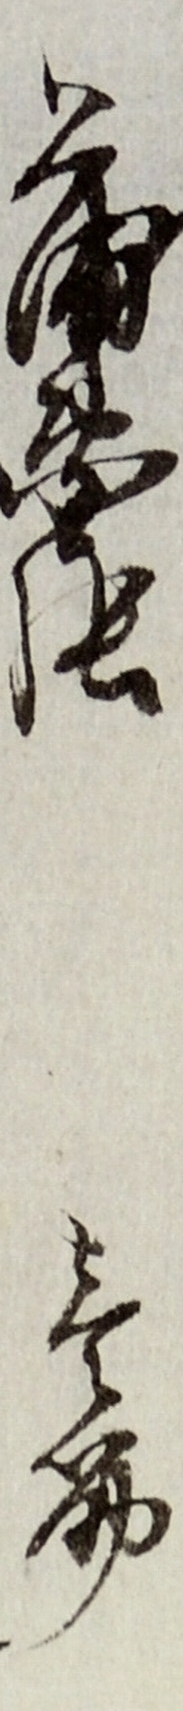蒲団張壱筋
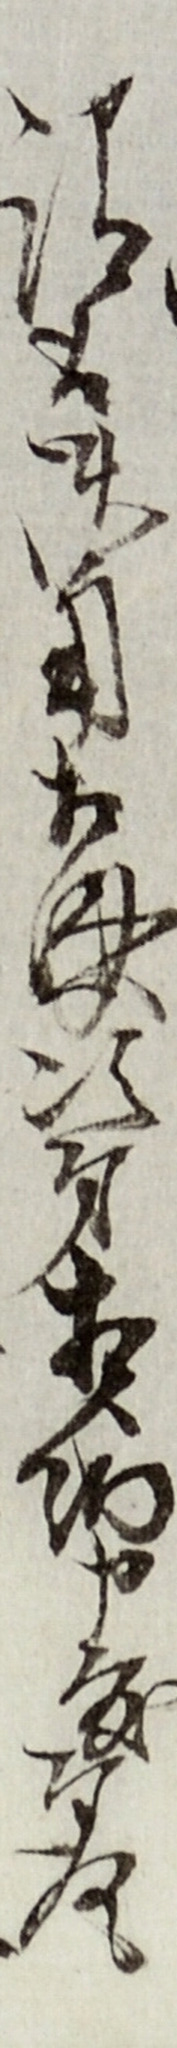請取御用相済次第相納申度奉存候
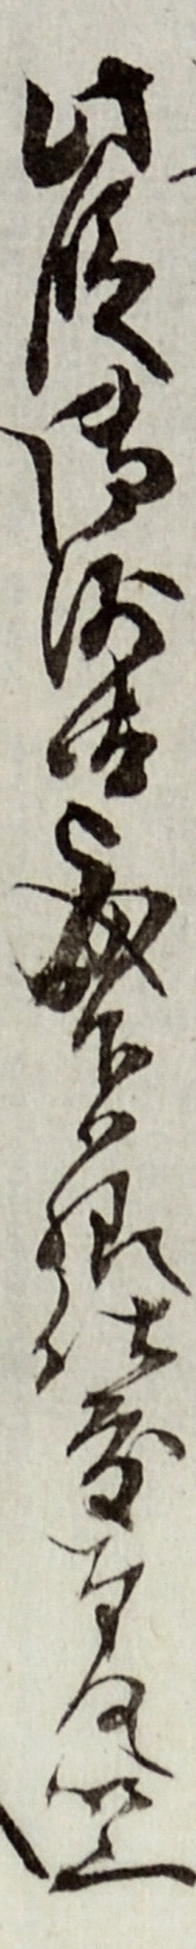此段御沙汰被成下候様仕度奉存候以上
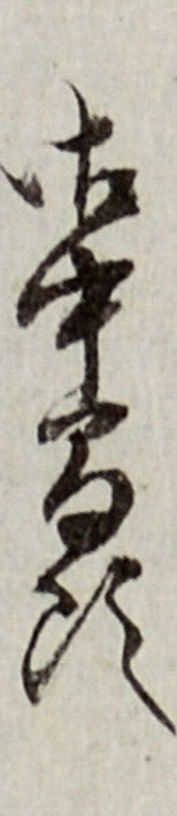御中間頭
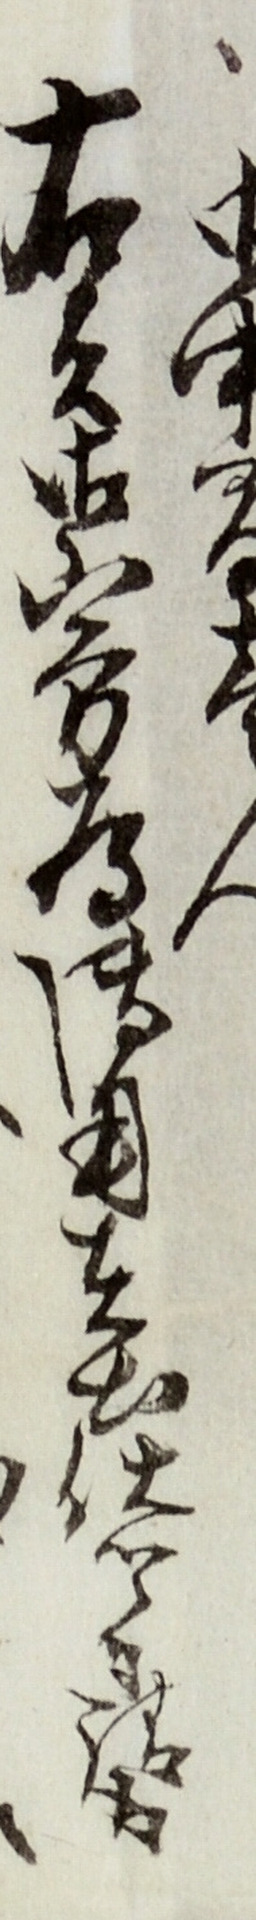右者御山方為御用在出仕候ニ付請取
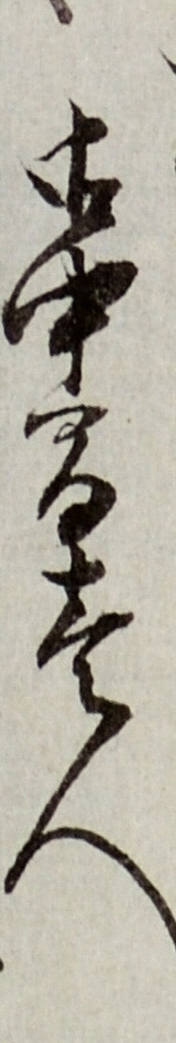御中間壱人
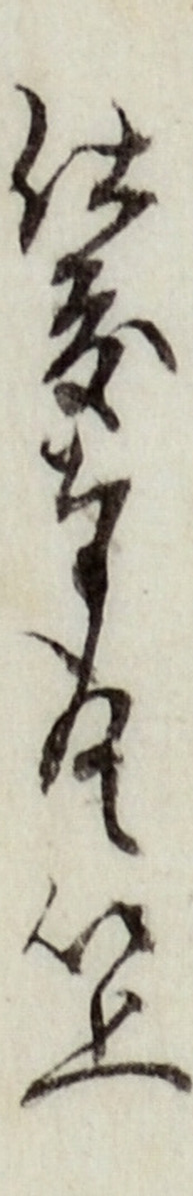仕度奉存候以上
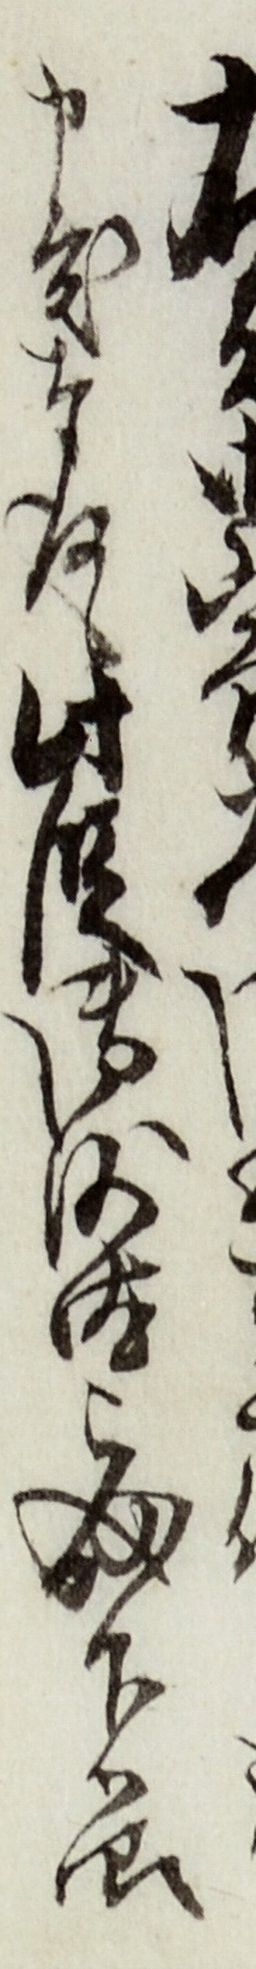申度奉存候此段御沙汰被成下候様

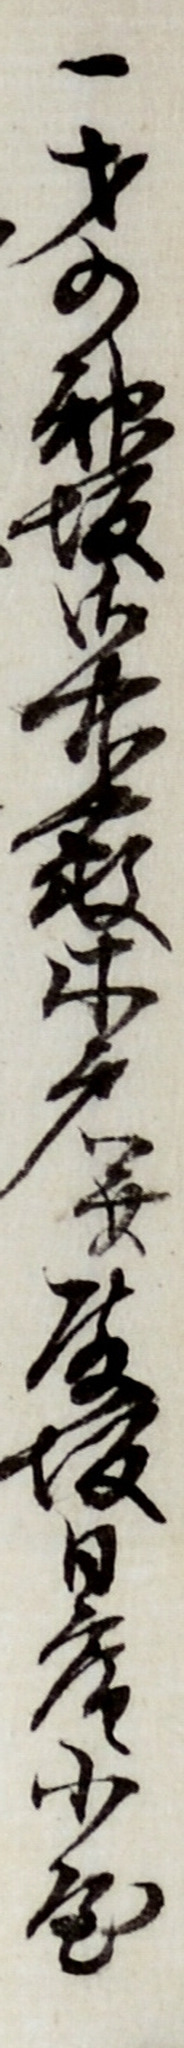一才の神坂御竹薮木戸并殿坂日雇小屋
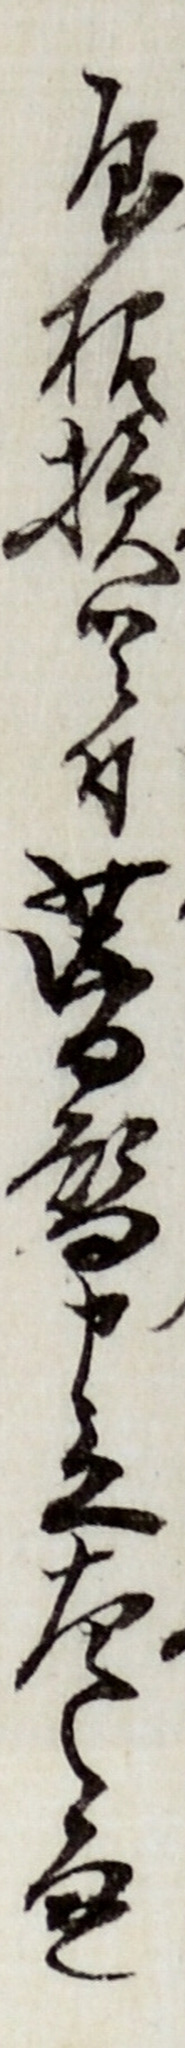屋根損候ニ付葺替申立左之通
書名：御山方御薪方諸事御用留
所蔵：伊那市立高遠町図書館・合同会社AMANE
